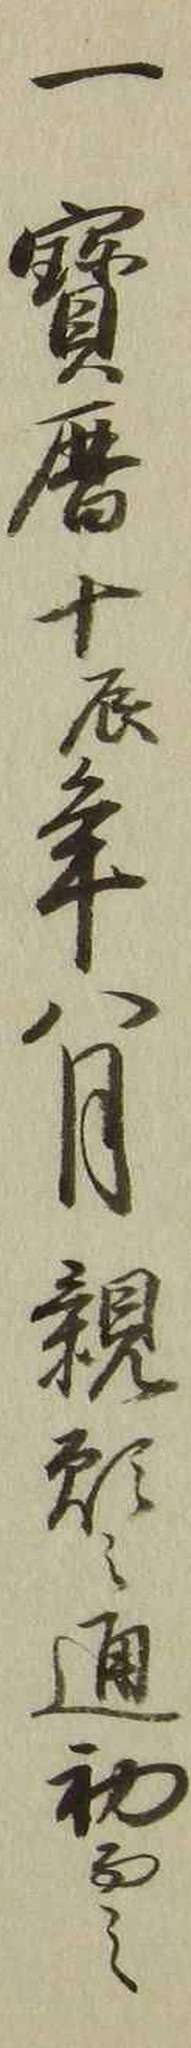一宝暦十辰年八月親願之通初而之
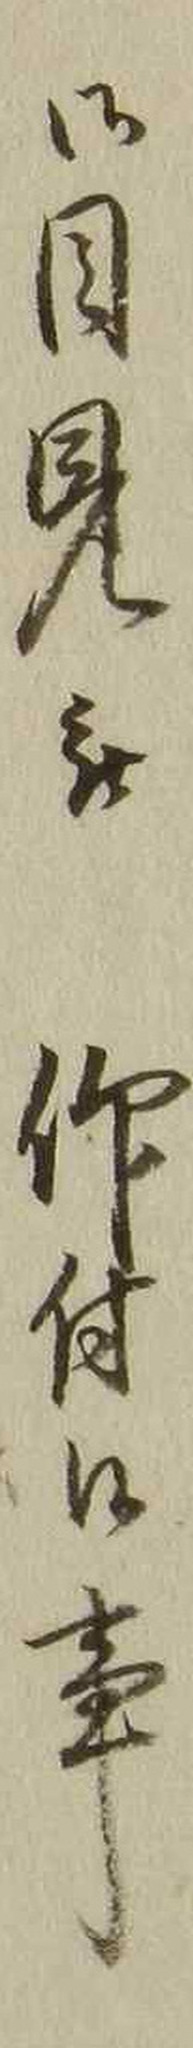御目見被仰付候事
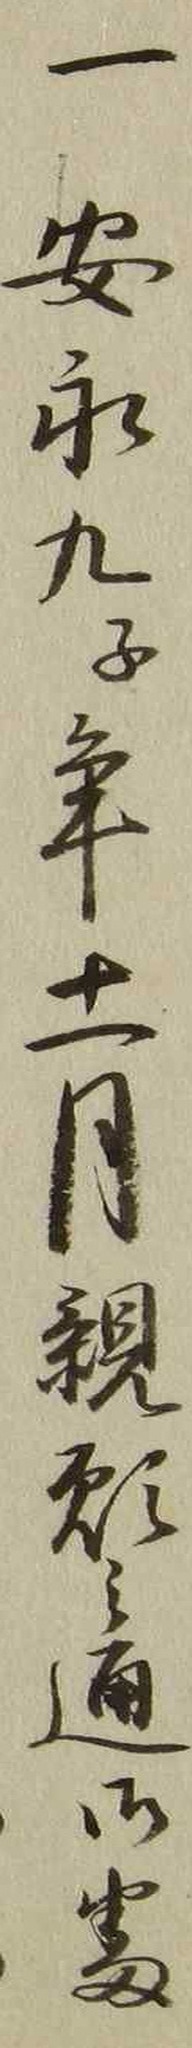一安永九子年十一月親願之通御番
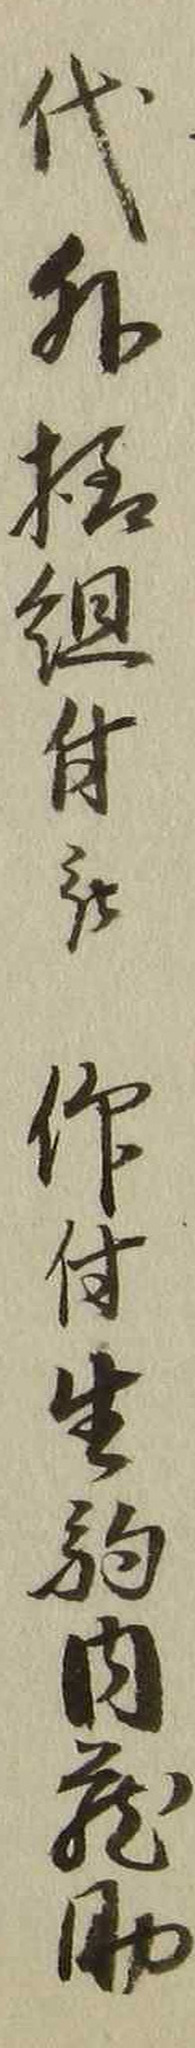代外様組付被仰付生駒内蔵助
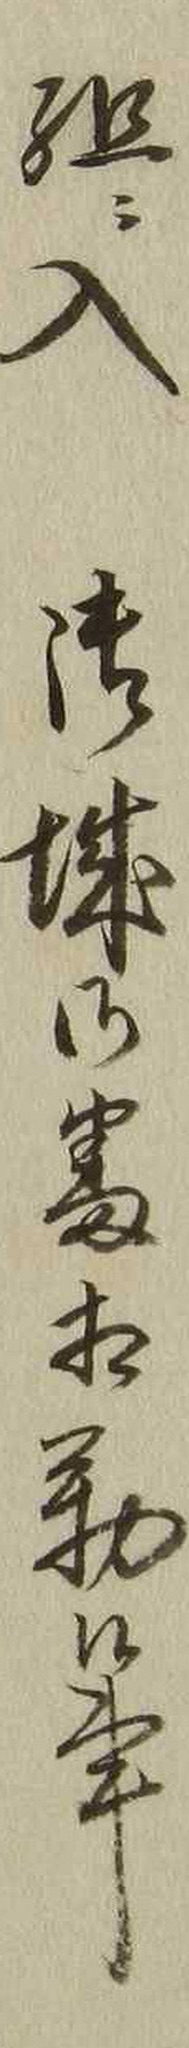組に入御城御番相勤候事
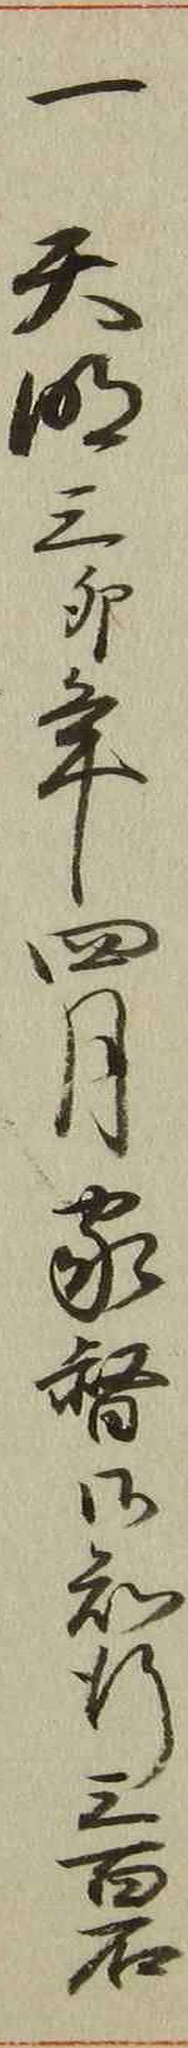一天明三卯年四月家督御知行三百石
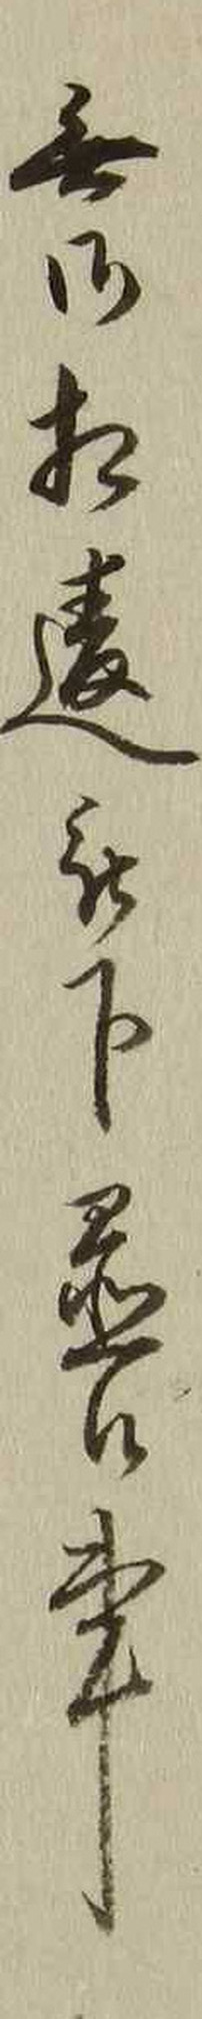無御相違被下置候事
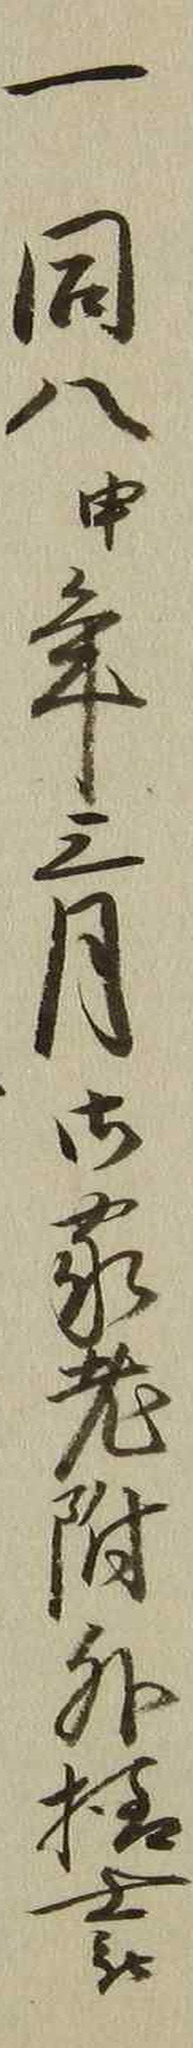一同八申年三月御家老附外様士被
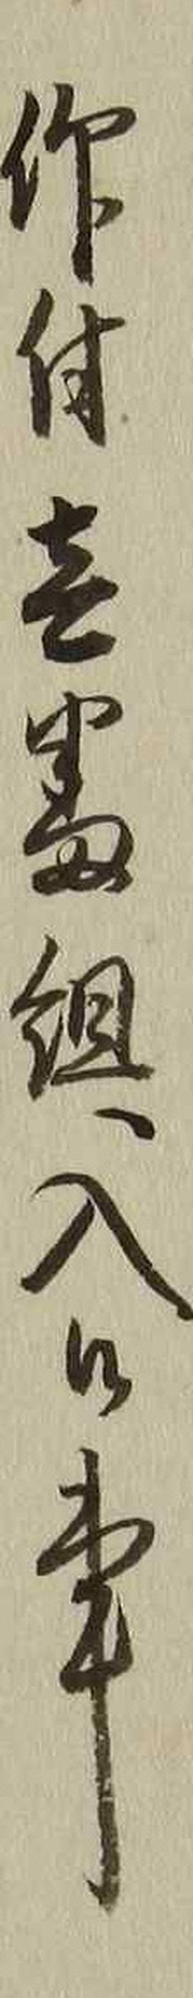仰付壱番組へ入候事
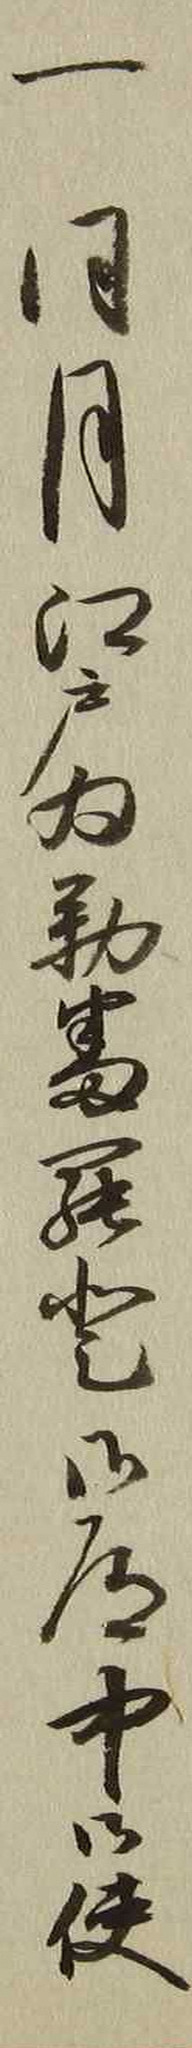一同月江戸為勤番罷登御道中御使
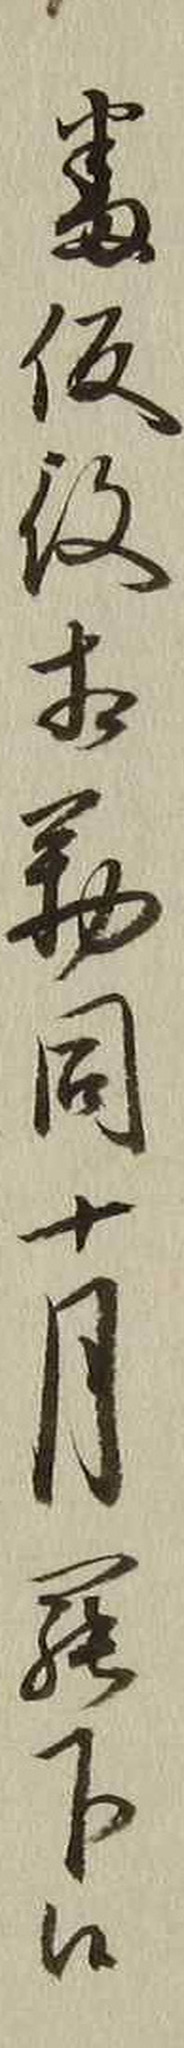番仮役相勤同十月罷下候
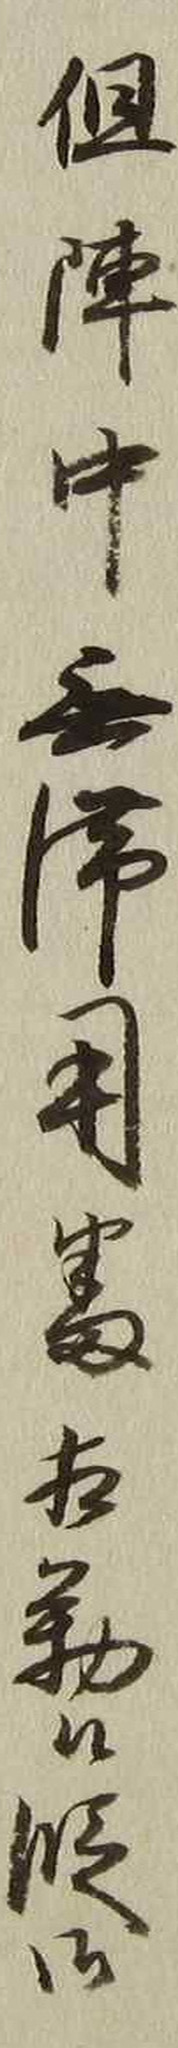但陣中無滞用番相勤候段御
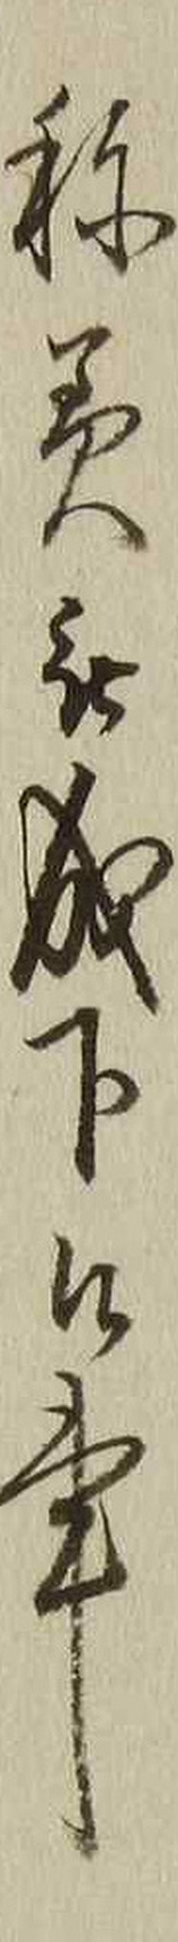称美被成下候事
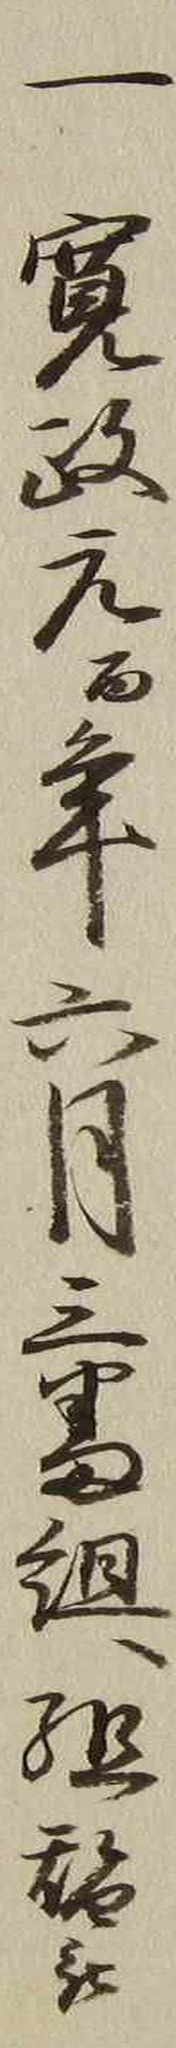一寛政元酉年六月三番組へ組替被
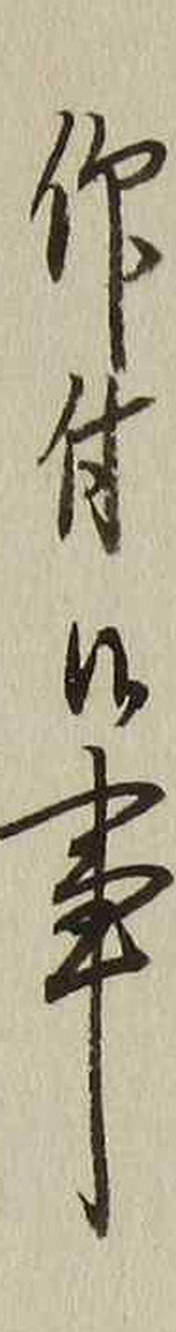仰付候事
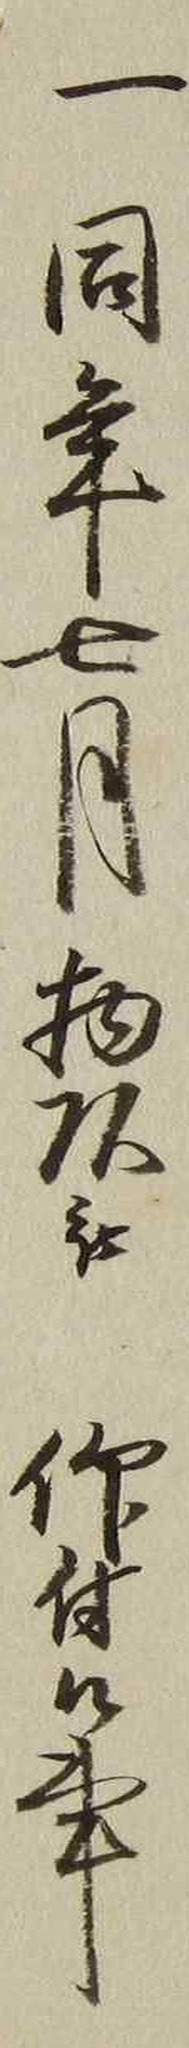一同年七月物頭被仰付候事
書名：諸士系譜　巻之133　た之部9
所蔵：会津若松市立会津図書館
